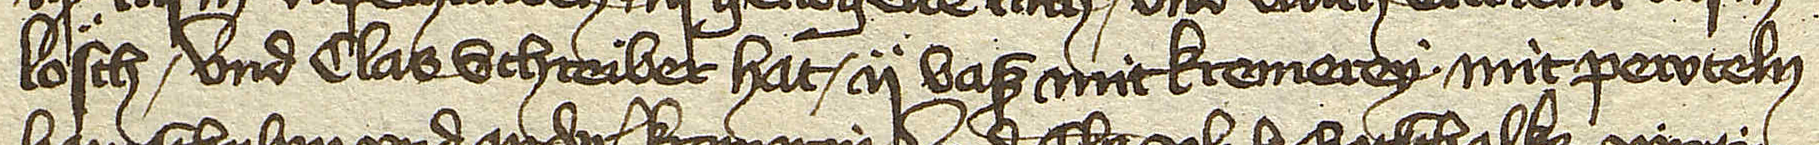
löſch / vnd Clas Schreiber hat / ii vaſʒ mit kremerey mit pewteln
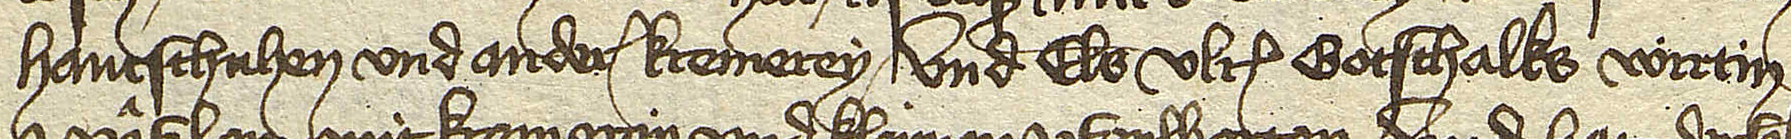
hantſchuhen vnd ander* kremerey / vnd Els vlr* Gotſchalks wirtin
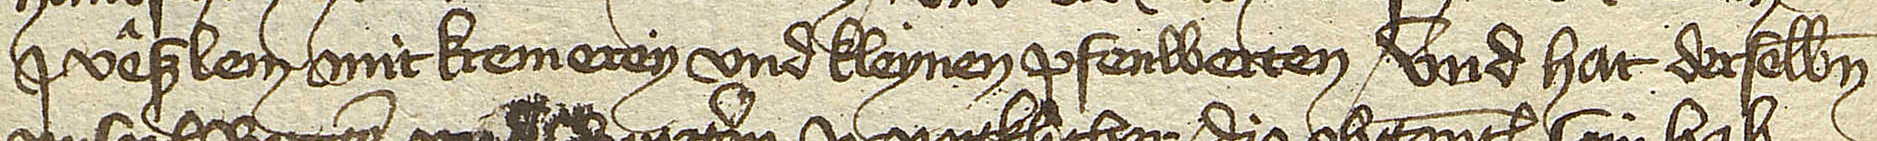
I vëſʒlein mit kremerey vnd kleynen pfenwerten / Vnd hat derſelbn*
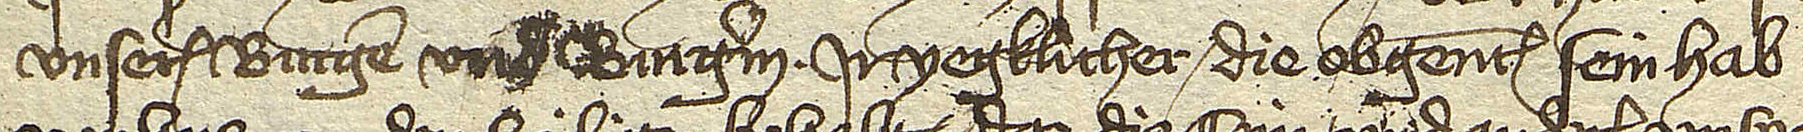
vnſer* Burge* vnd Burg*in . Ir yegklicher / die obgent* ſein hab
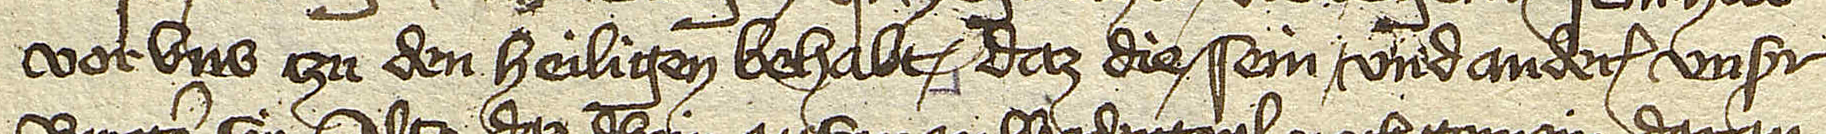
vor vns cʒu den heiligen behabt / daʒ die / ſein / vnd ander* vnſ*r
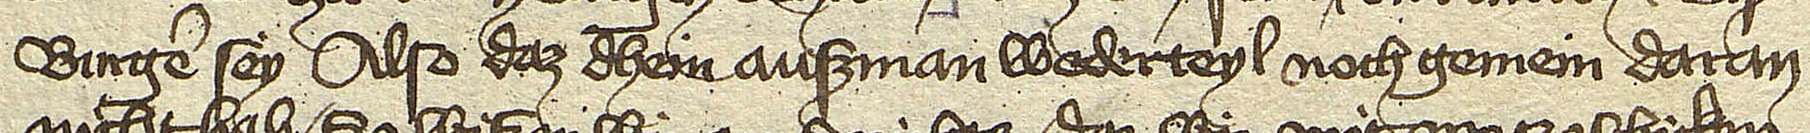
Burge* ſey Alſo daʒ dhein auſʒman wederteyl noch gemein daran
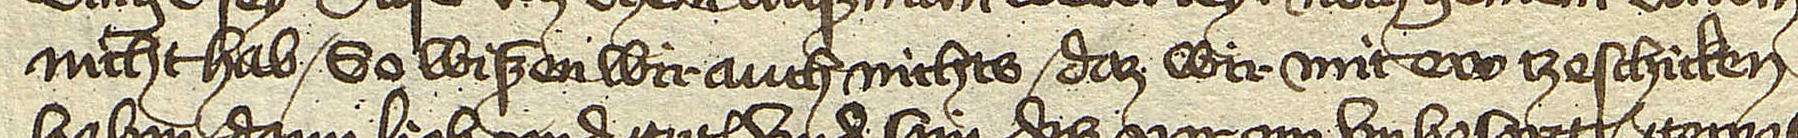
nicht hab / So wiſʒen wir auch nichts / daʒ wir mit ew cʒeſchicken
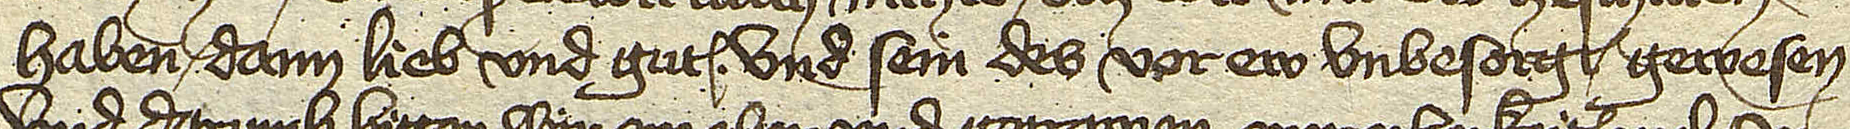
haben / dann lieb vnd gut* . vnd ſein des vor ew vnbeſorgt / geweſen
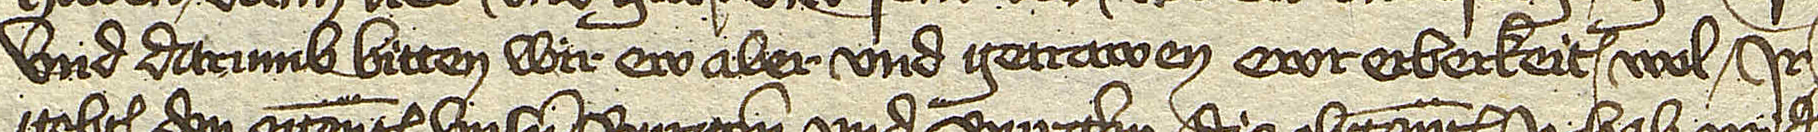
vnd darumb bitten wir ew aber vnd getrawen ewr erberkeit* wol / Ir
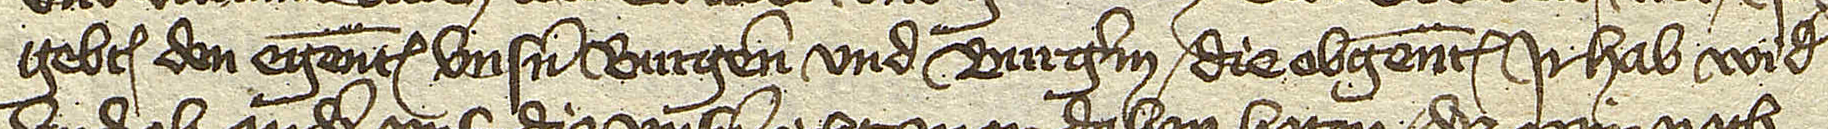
gebt* den egen*t* vnſn* Burge*n vnd Burg*in / die obgent* Ir hab wid*
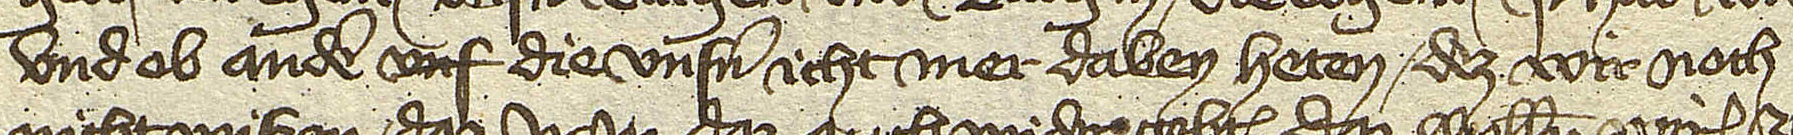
vnd ob ande* vnſ die vnſn* icht mer dabey heten / deʒ wir noch
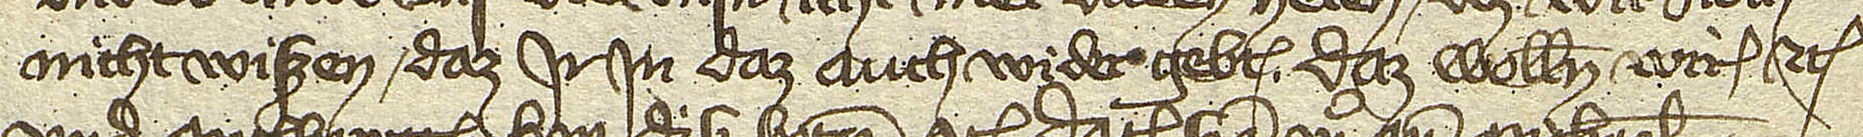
nicht wiſʒen / daʒ Ir In daʒ auch wider gebt* . daʒ wolln* wir* ec*
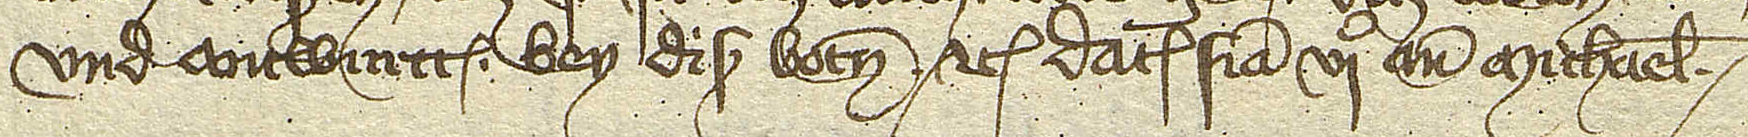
vnd antwurtt* . bey diſ* botn* ec* dat* fia* vi* an* Michael* . /
